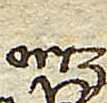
ercʒ
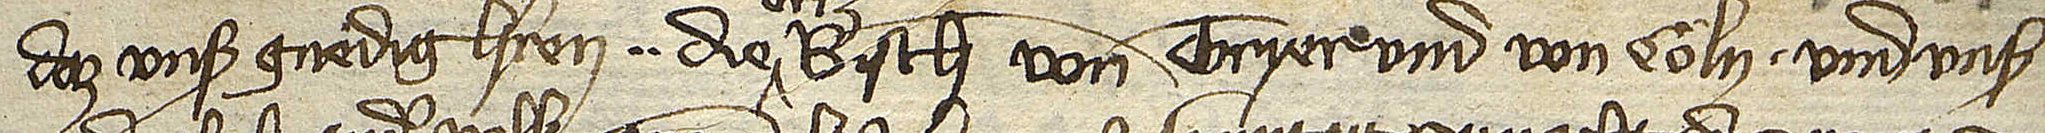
daʒ vnſ* gnedig h*ren ~ die Biſch* von Tryer vnd von Cöln . vnd vnſ*
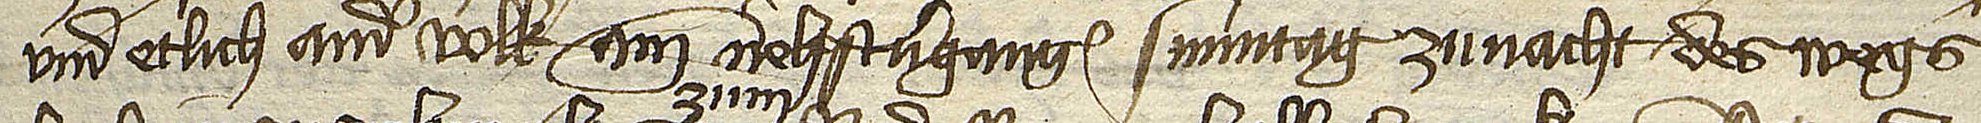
vnd etlich and* volk am* nehſtu*gang* ſunntag ʒu nacht / des wegs*
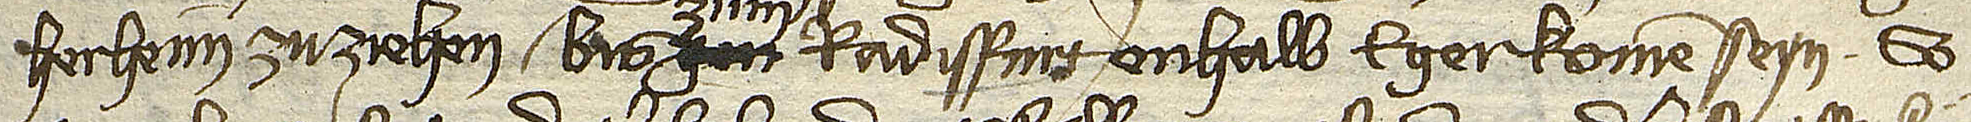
herheim ʒu ʒiehen / bis gen Radiſfurt enhalb Eger kome* ſeyn . So
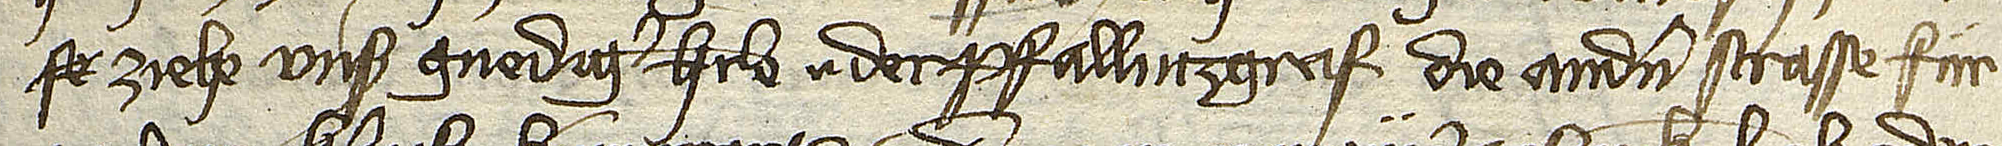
ſe ʒiehe vnſ* gnedig* h*re ~ der Pfallncʒgraf die and*n ſtraſſe für
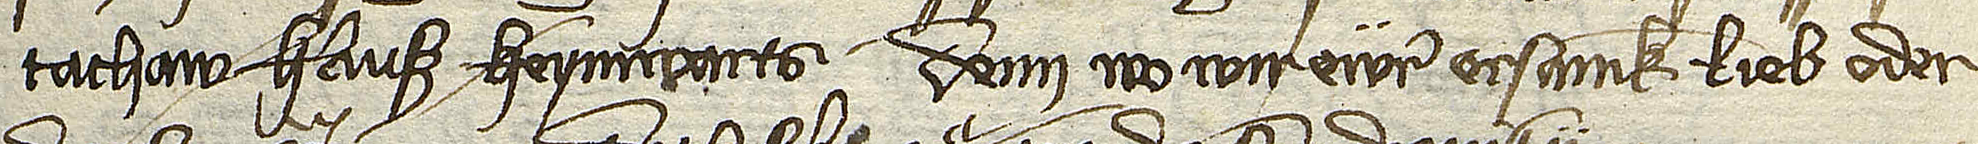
tachaw h*auſʒ heymwarts / Denn wo wir ew*r erſamk* lieb oder
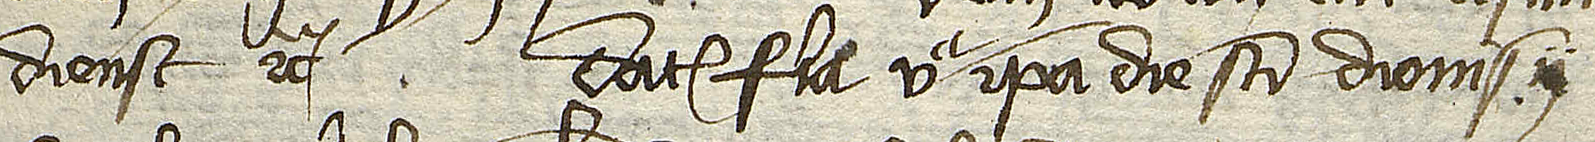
dienſt ec* . Dat* fia* v* ipa* die ſti dioniſii
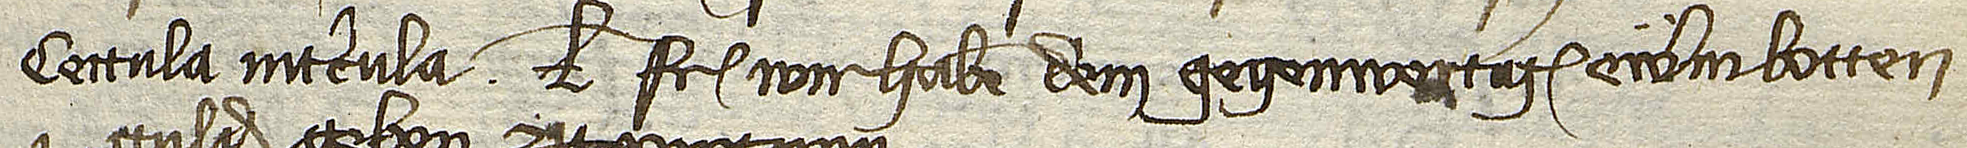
Cettula intcula* . L* fr* wir habe* dem gegenwertig* ew*m botten
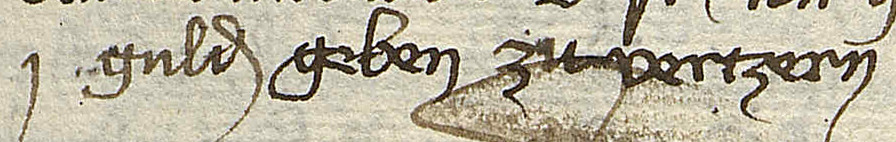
i guld* geben ʒu vercʒern
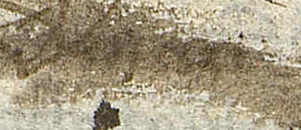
Den von
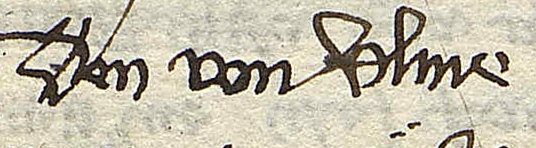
Den von Vlme
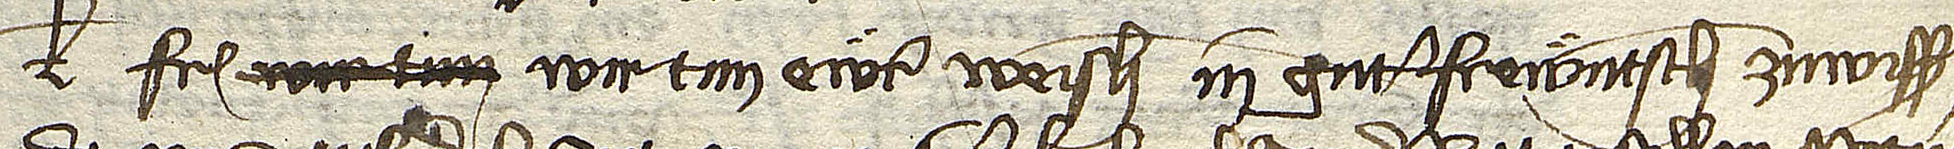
L* fr* wir tun wir tun ew*r weiſh* in gut* frewntſch* ʒuwiſſ*
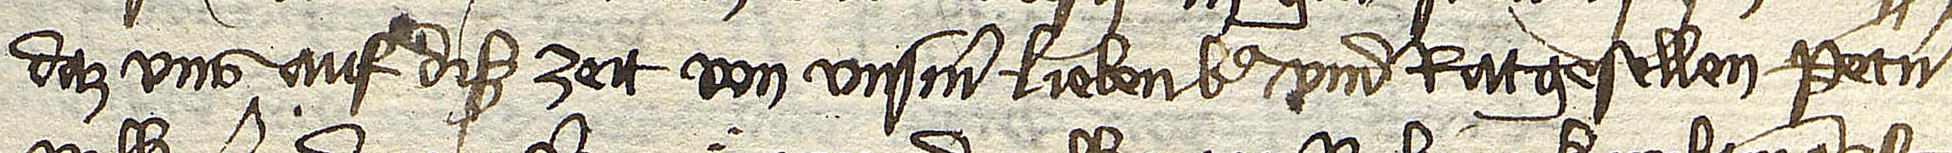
daʒ vns auf diſʒ ʒeit von vnſ*m lieben b* vnd Ratgeſellen Pet*n
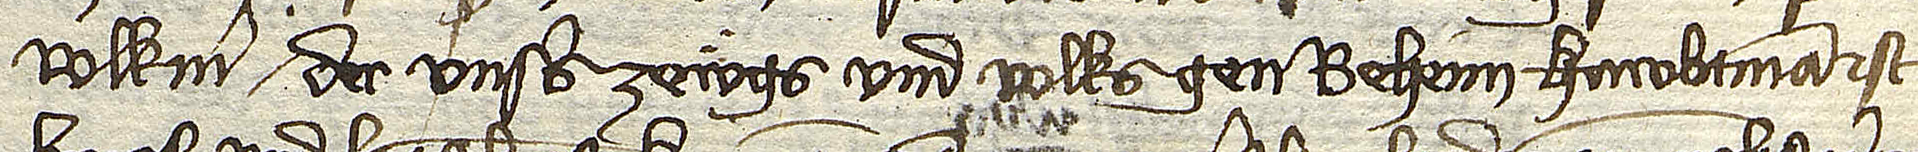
volkm* / der vnſ*s ʒewgs vnd volks gen Beheim hawbtma* iſt
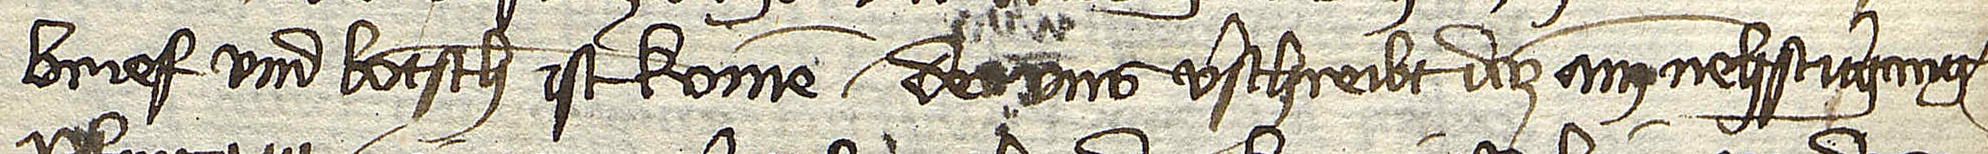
brief vnd botſch* iſt kome* / der vns v*ſchreibt daʒ am* nehſtu*gang*
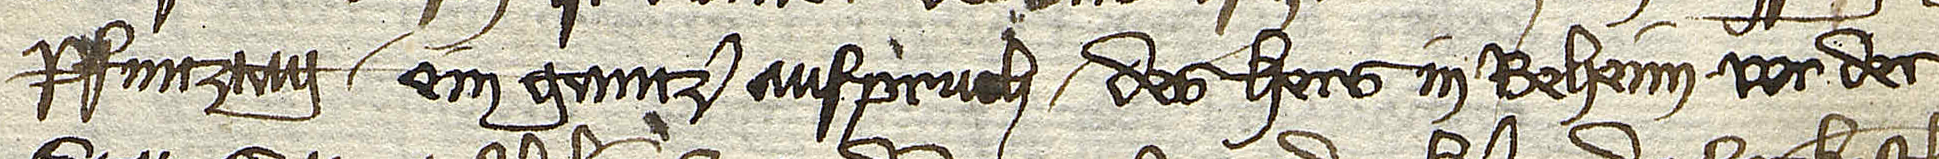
Pfincʒtag / ein gancʒ* aufpruch / des hers in Beheim vor der
